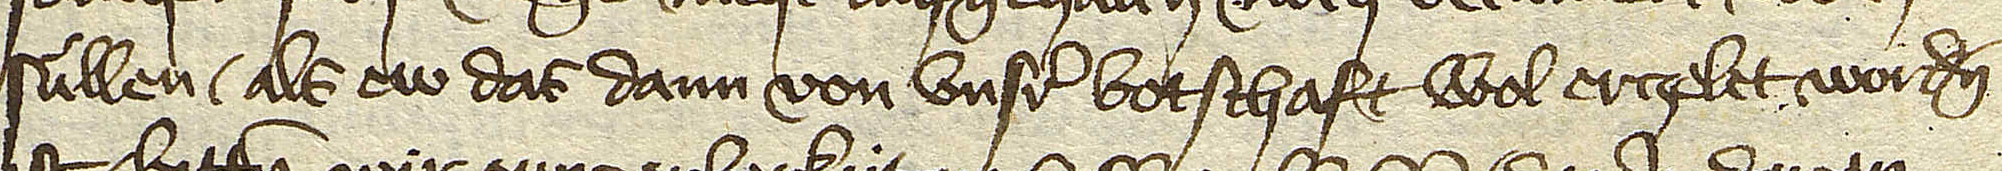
ſüllen / als ew das dann von vnſr* botſchaft wol ercʒelet word*
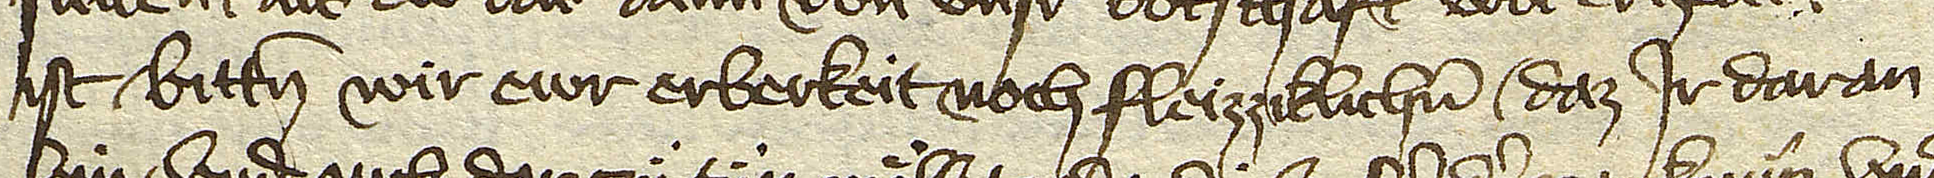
iſt / bittn* wir ewr erberkeit noch fleiʒʒiklichn* / daʒ Ir daran
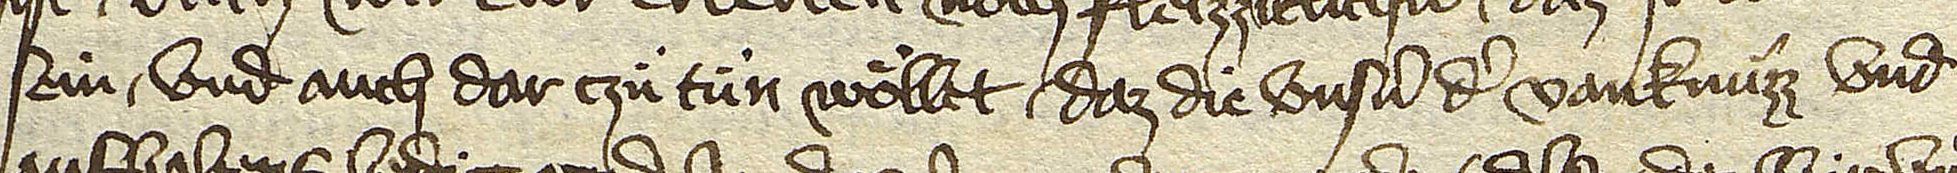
ſein / vnd auch dar cʒü tün wöllet / daʒ vnſn* d* vanknüʒʒ vnd
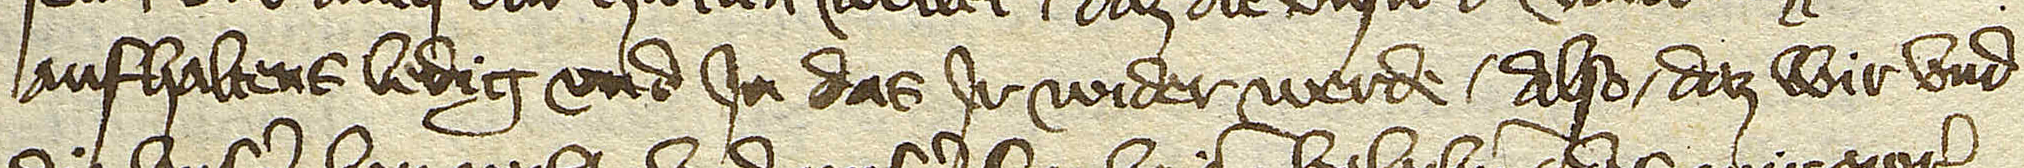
aufhaltens ledig vnd In das Ir wider werde / Alſo / daʒ wir vnd
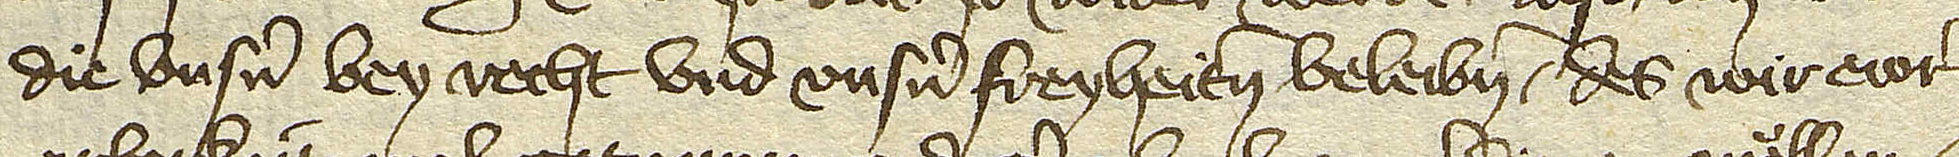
die vnſn* bey recht vnd vnſn* freyheitn* beleibn* / des wir ewr*
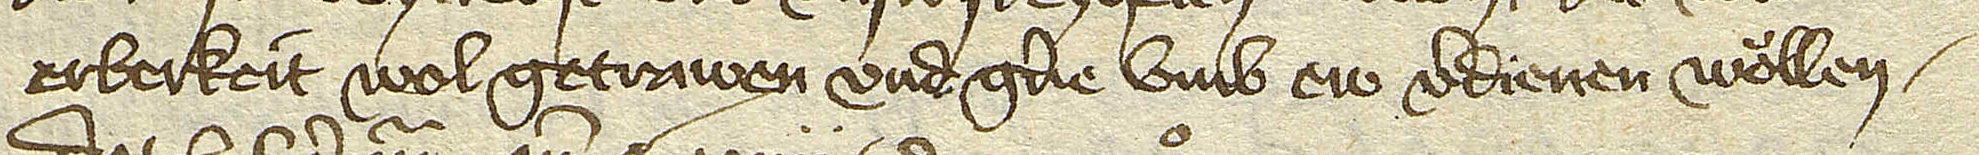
erberkeit wol getrawen vnd g*ne vmb ew v*dienen wöllen /
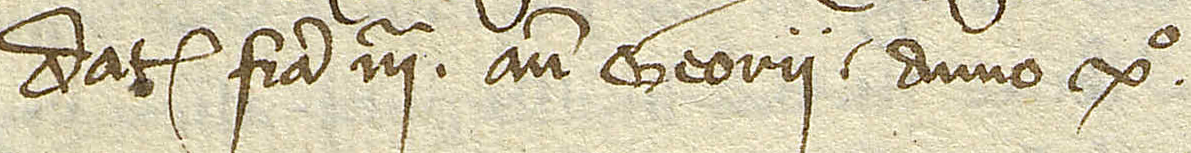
Dat* fia* iii . an* Georii / Anno x* .
